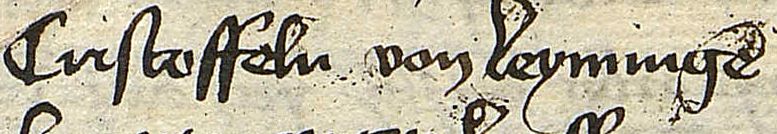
Criſtoffeln von Leymnige*
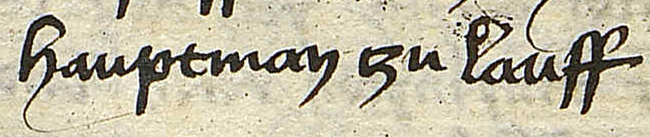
hauptman cʒu lauff
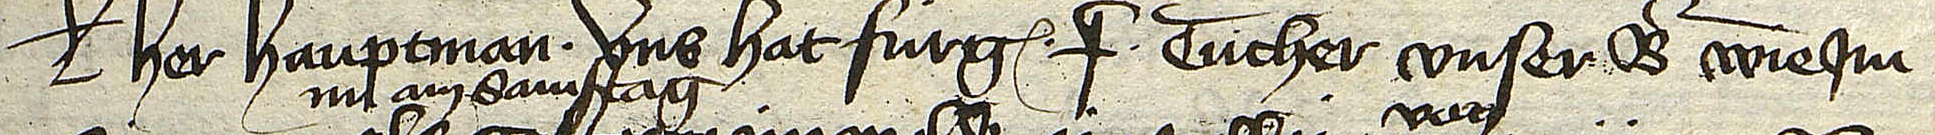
L* her hauptman . Vns hat fürg* . F . Tucher vnſer B* wie Im
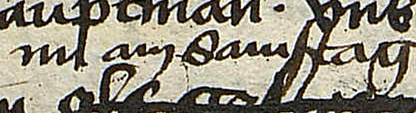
nu am samſtag
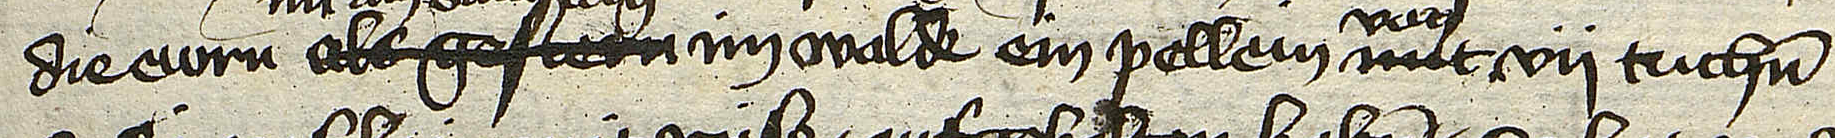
die ewrn als geſtern im walde ein pellein mit vii tuch*n
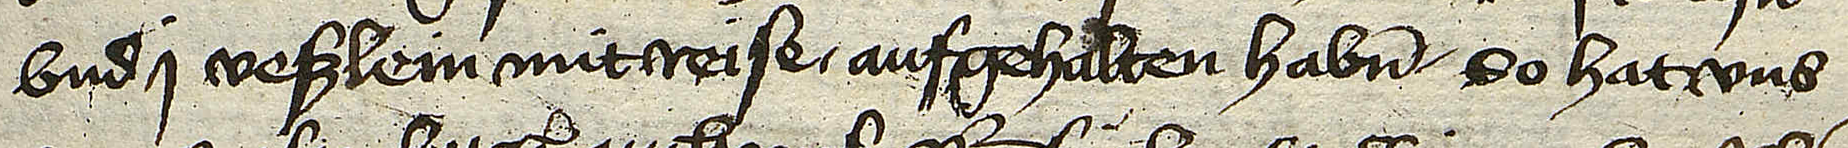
vnd i veſʒlein mit reiſe / aufgehalten hab*n / So hat vns
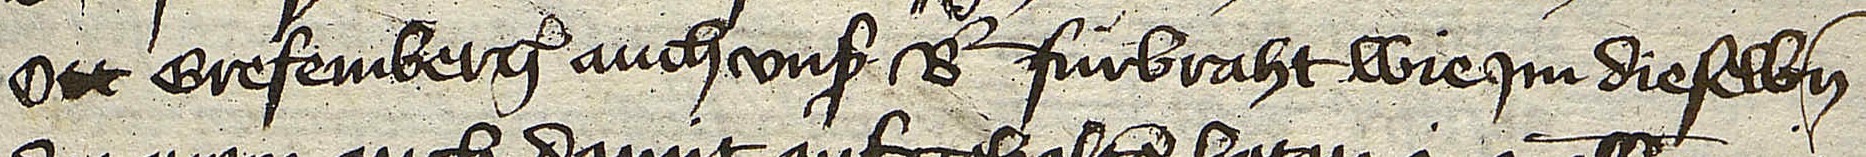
Ott Grefemberg* auch vnſ* B* fürbraht wie Im dieſelb*n
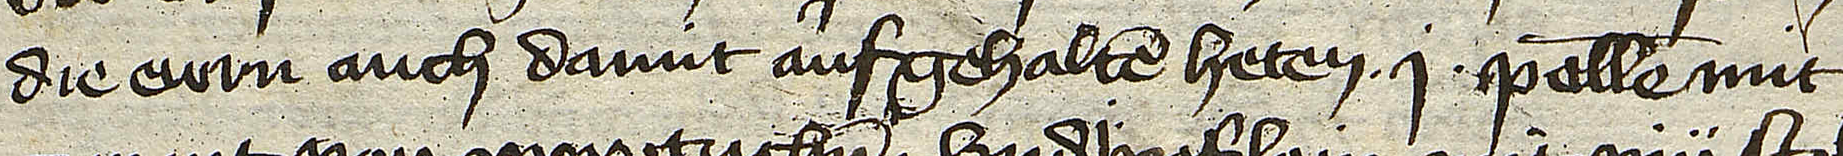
die ewrn auch damit aufgehalte* heten . i . palle* mit
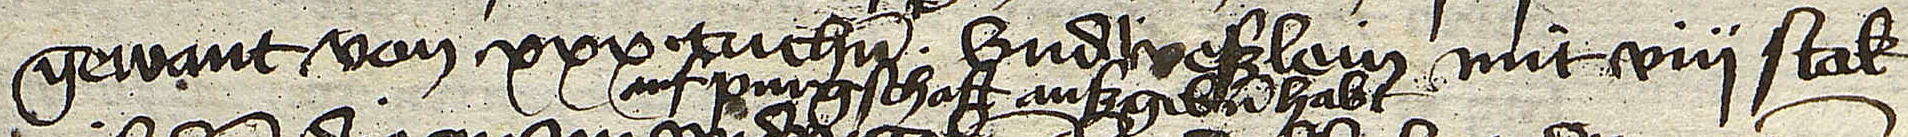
gewant von xxx . tuch*n . vnd I veſʒlein mit viii ſtok -
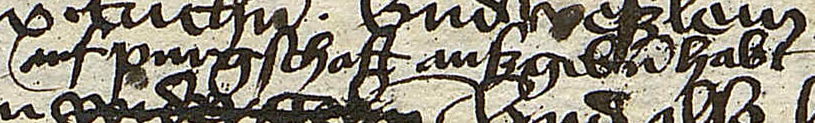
auf purgſchaft auſʒgebn* habt
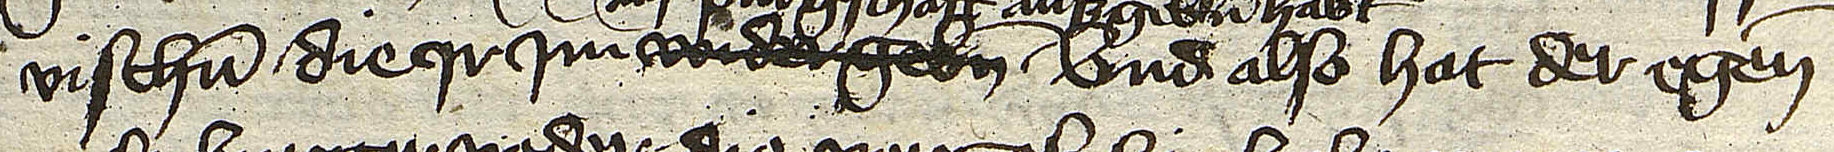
viſch*n / die Ir Im wider geb*n / vnd alſo hat der egen*
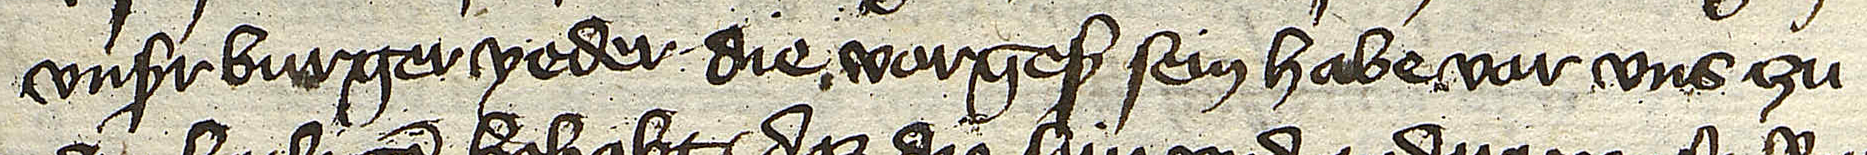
vnſr* burger yeder die vorgeſ* ſein habe vor vns cʒu
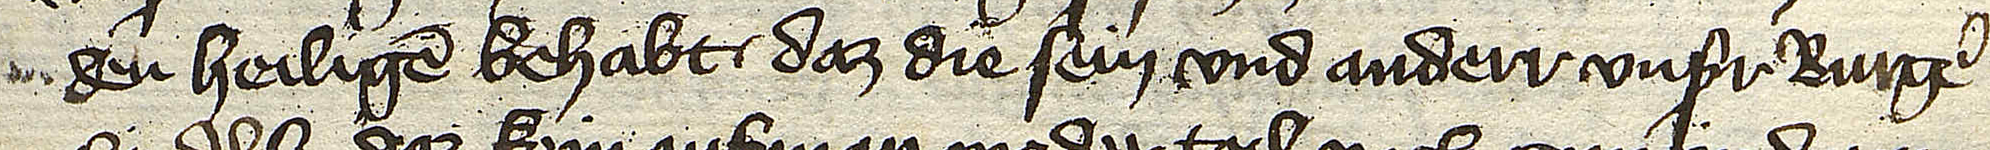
den heilige* behabt / daʒ die ſein vnd anderr vnſ*r Burge*
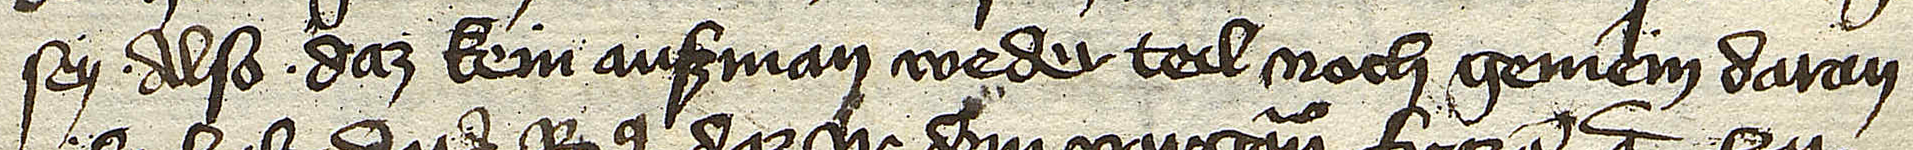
ſey . Alſo . daʒ kein auſʒman weder teil noch gemein daran
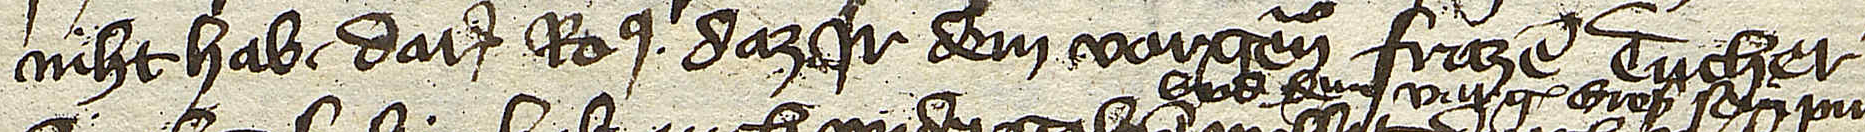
niht hab / dar* Ro* . daʒ Ir dem vorgen* friʒe* Tucher
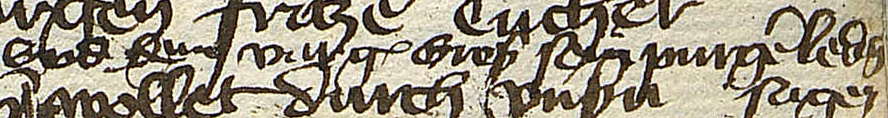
vnd dem vorg* Gref* ſein purge* ledig
